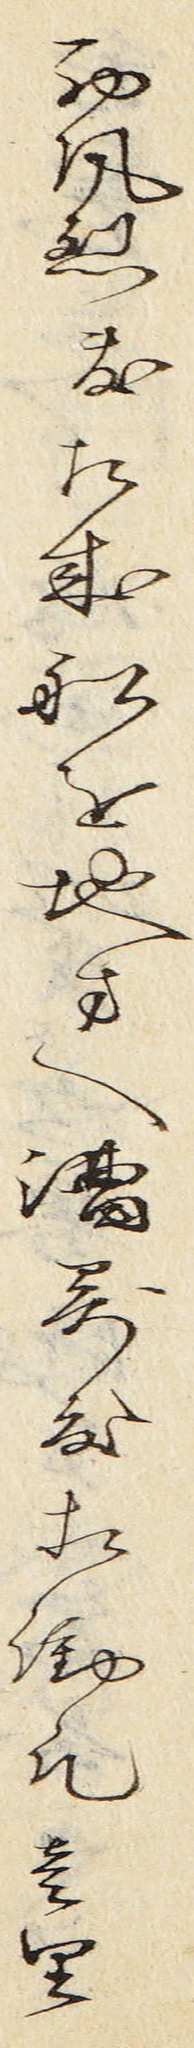西風烈敷相成船を地方へ漕寄琢度相働凡壱里
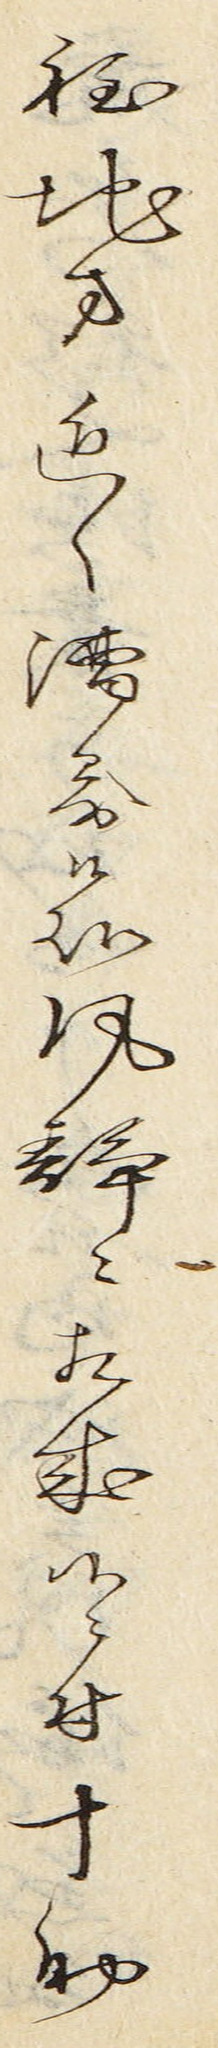程地方近く漕寄候処風静に相成候に付十助

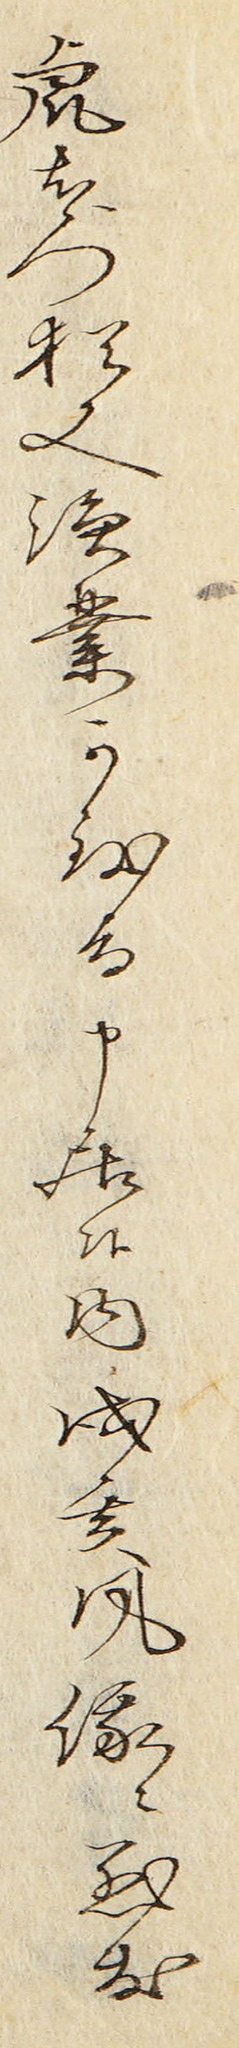虎右衛門猶又漁業可致旨申居候内戌亥風俄に烈敷
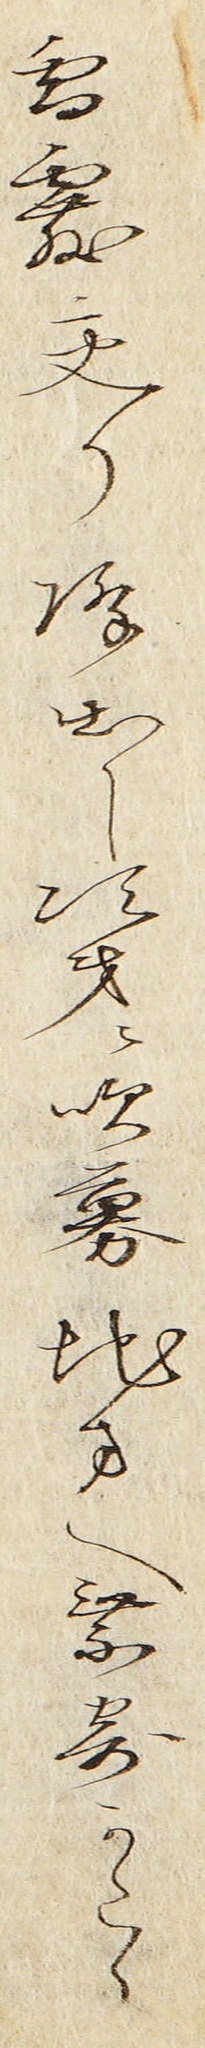雪霰交り降出し次第に吹募地方へ寄かたく
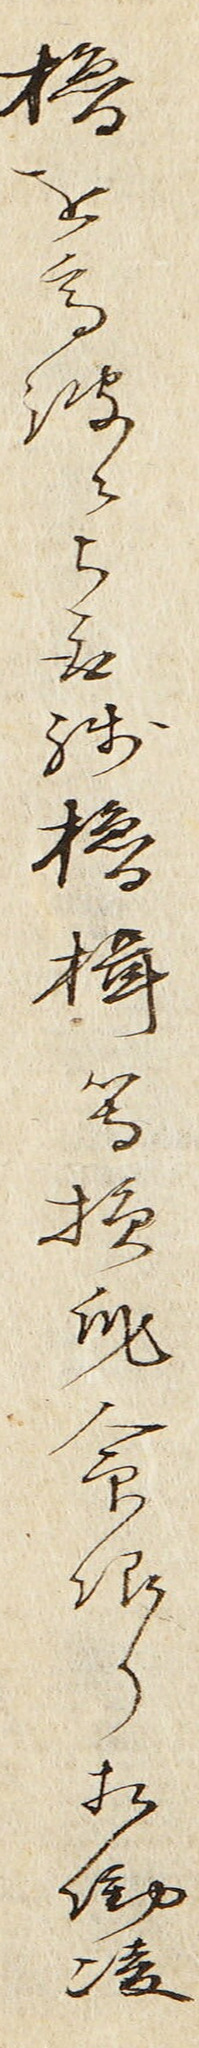櫓を高浪に被取残櫓楫等損身命限り相働凌
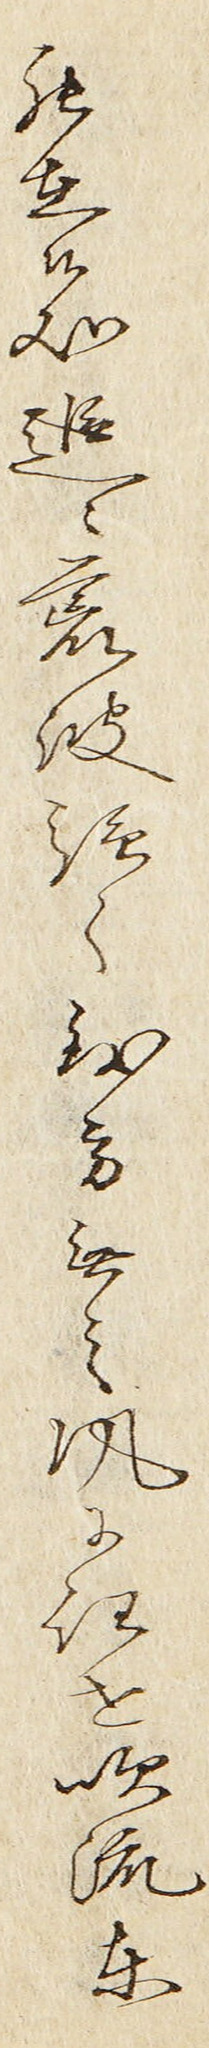罷在候処追々荒波強く致方無之風に任せ吹流東
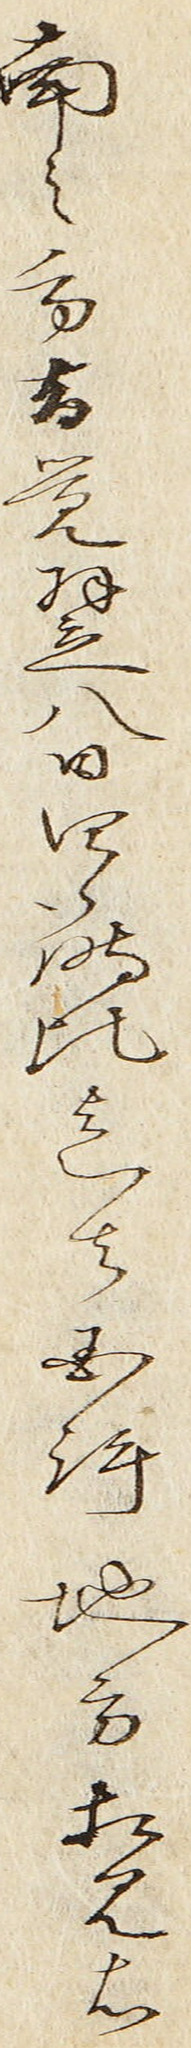南之方旨覚翌八日四ッ時比迄は国許地方相見右
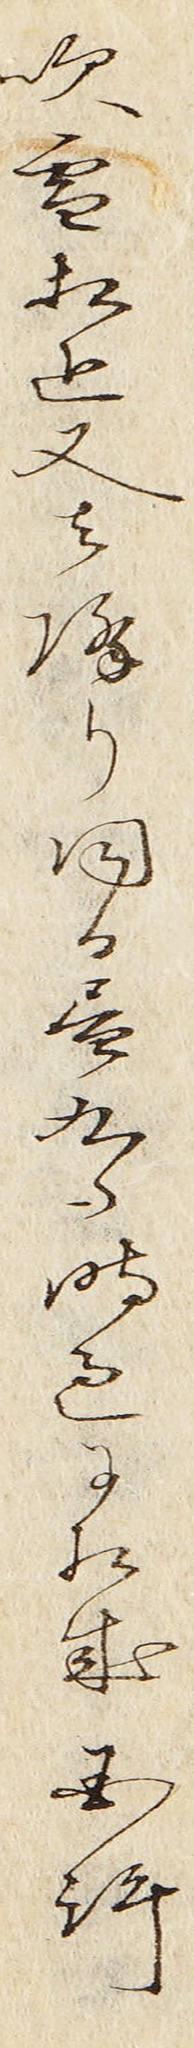吹雪相止又は降り同日昼九ッ時過に相成国許
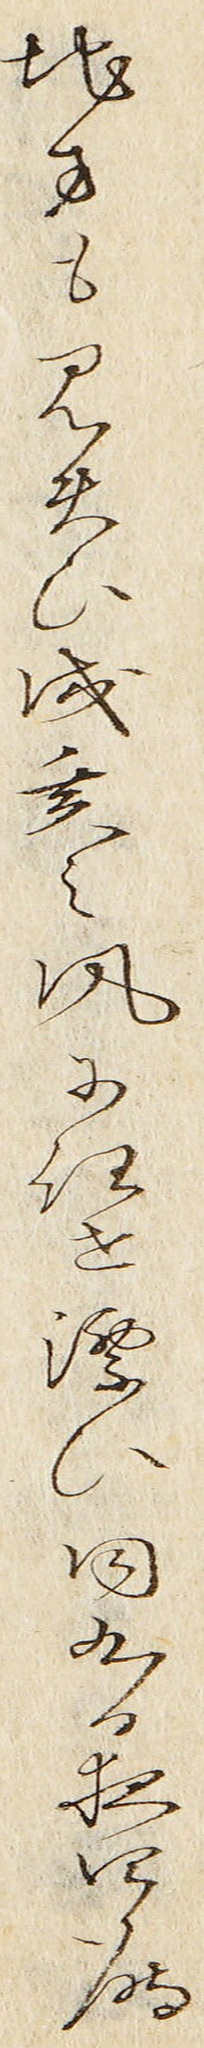地方も見失ひ戌亥之風に任せ漂ひど同九日夜四ッ時
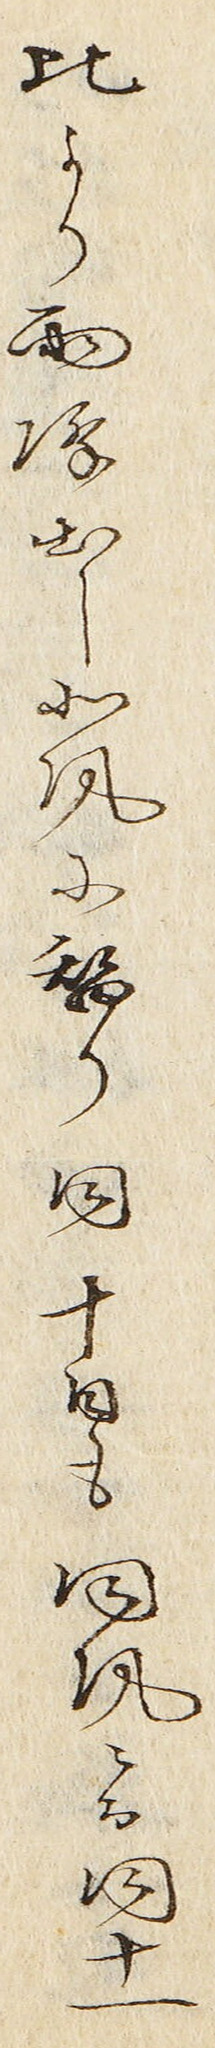比より雨ふり降出し北風に替り同十日も同風に而同十一
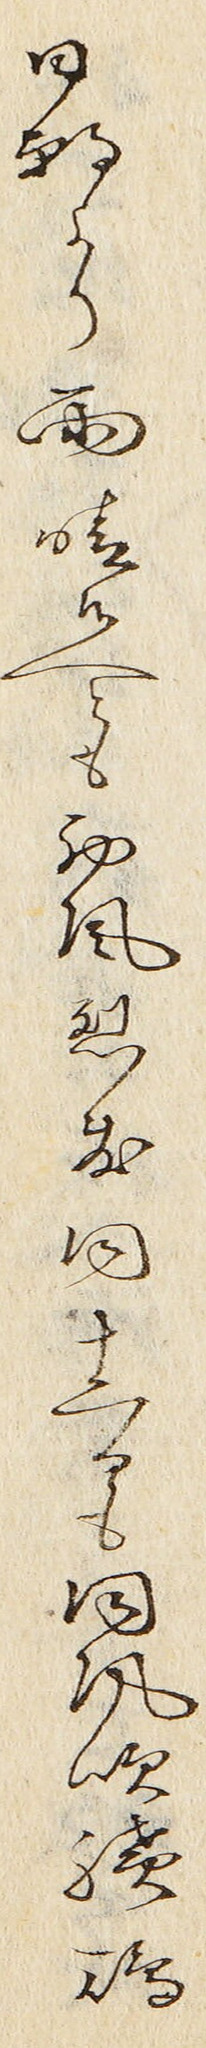日朝より雨晴れ候へとも西風烈敷同十二日も同風吹積嶋
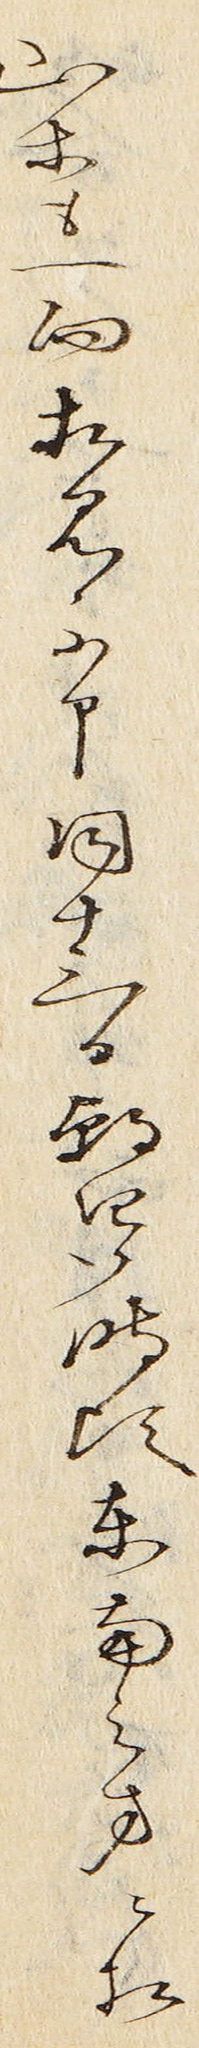山等も一向相見不申同十三日朝四ッ時頃東南之方に相
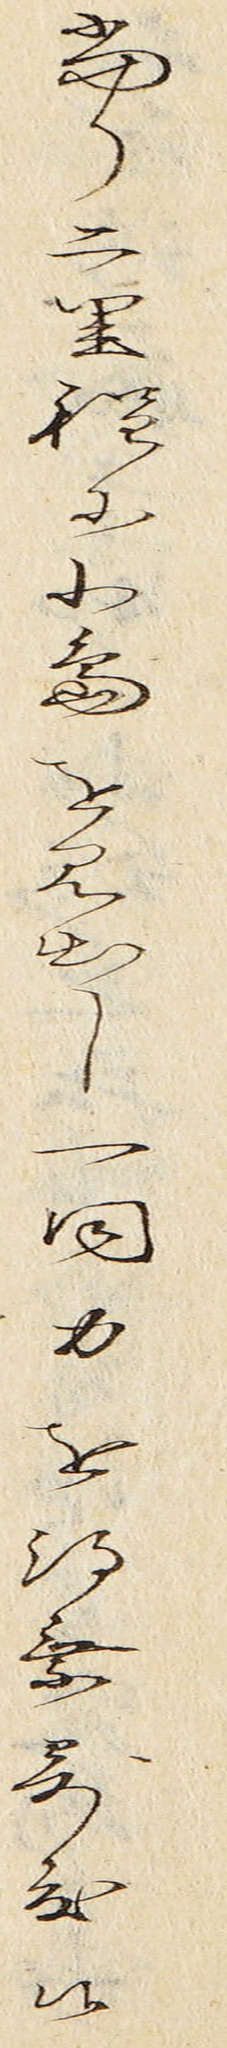当り二里程に小島を見出し一同力を得乗寄度候
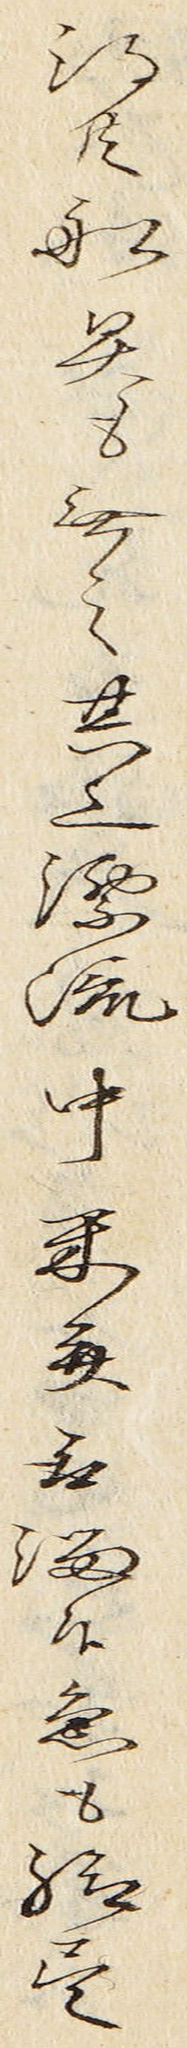得共船具も無之其上漂流中米并取溜候魚も給尽
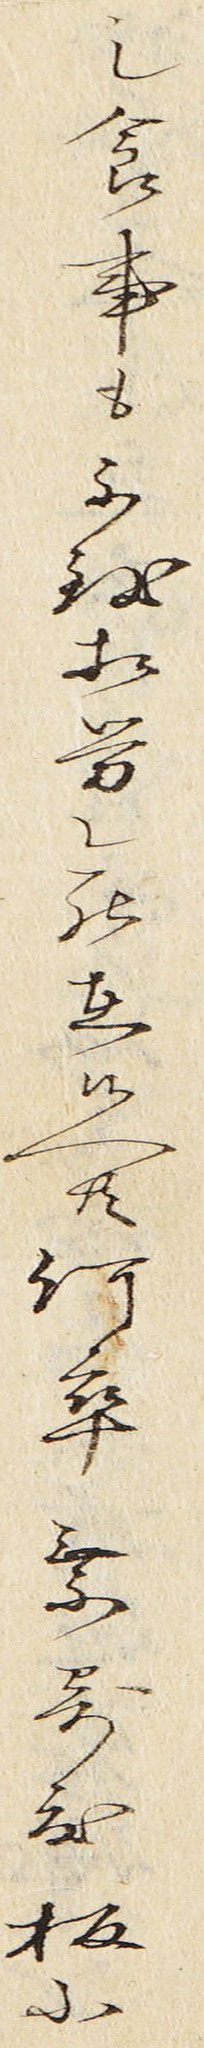し食事も不致相労れ罷在候へ共何卒乗寄度板小
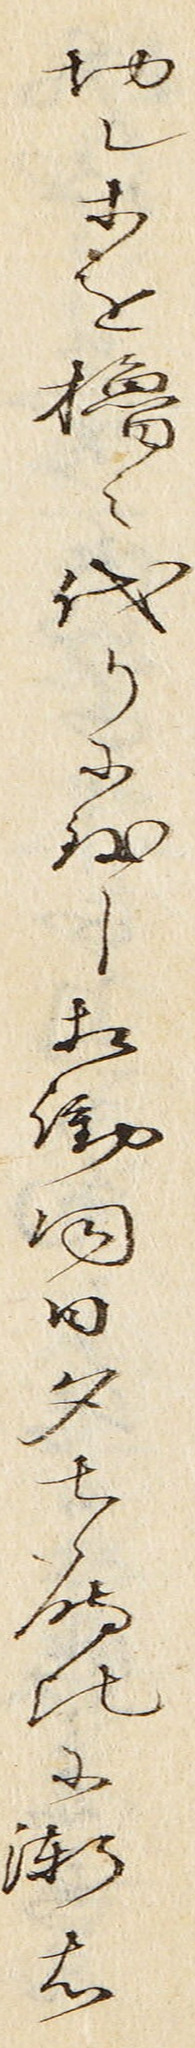切れ等を櫓之代りに致し相働同日夕七ッ時比に漸右
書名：土佐中浜万次郎漂流記
